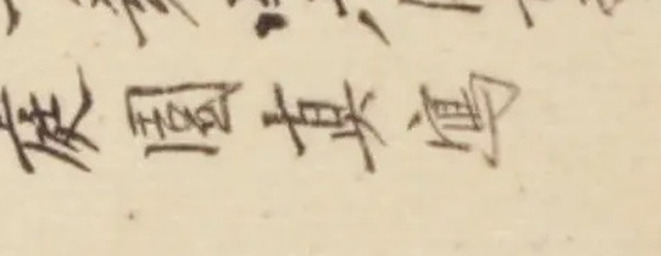庭園真写
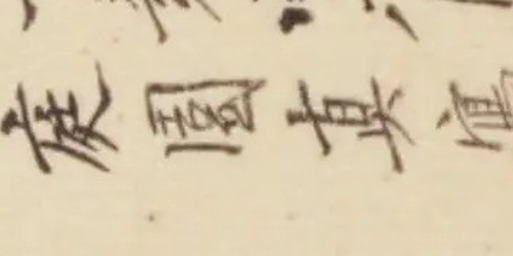庭園真写
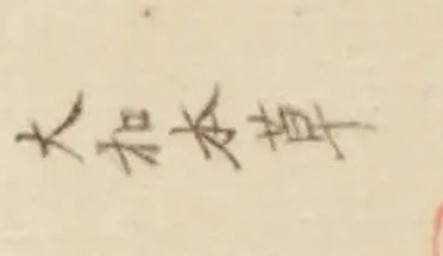大和本草

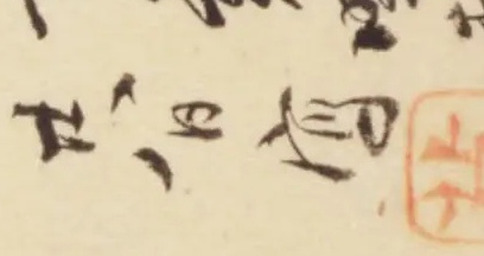廿八日写
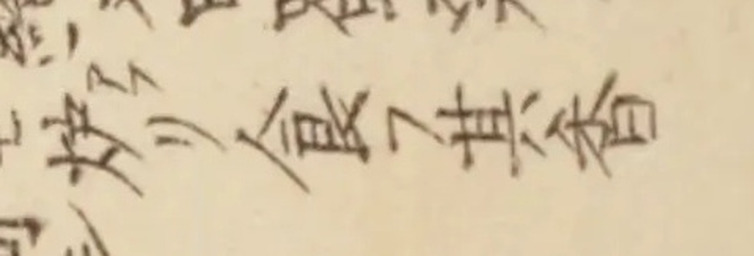葉モ炉リ食フ其香
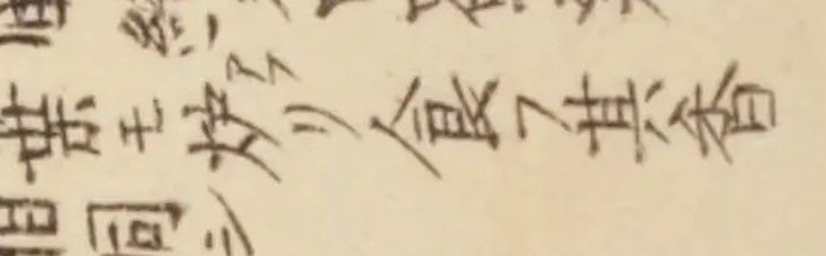葉モ炉リ食フ其香
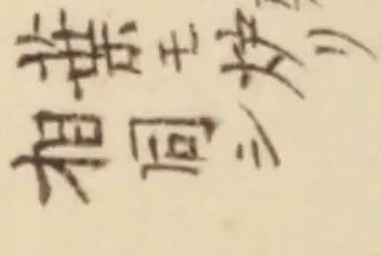相同シ
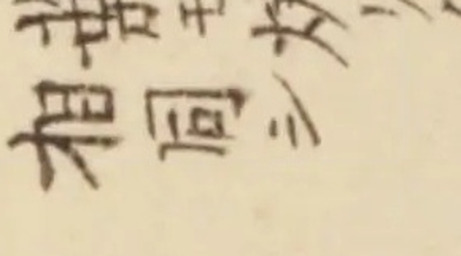相同シ
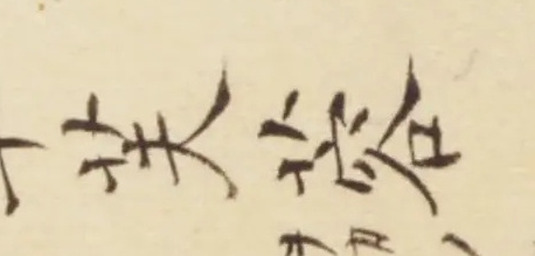草芙蓉
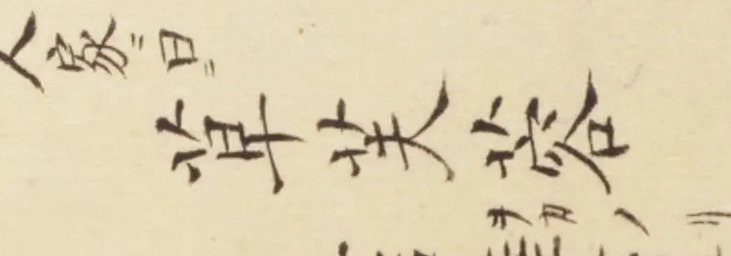草芙蓉
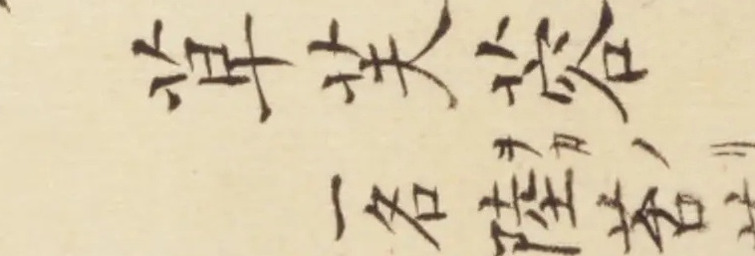草芙蓉
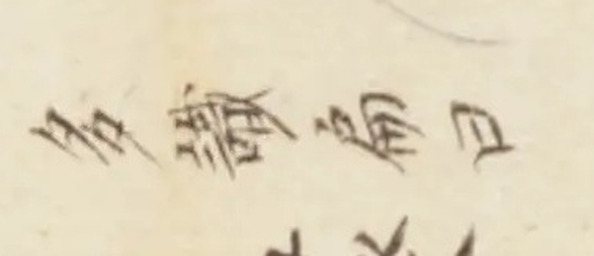多識扁曰
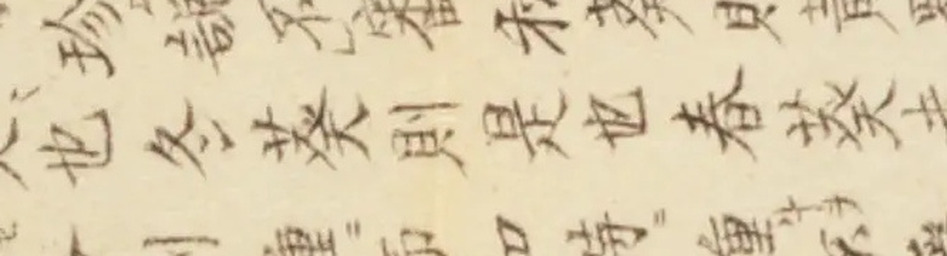葵也冬葵即是也春葵未
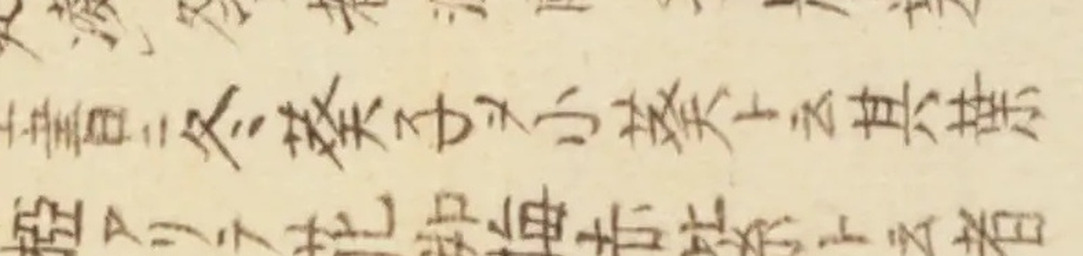全書ニ冬葵子ヲ小葵ト云其葉
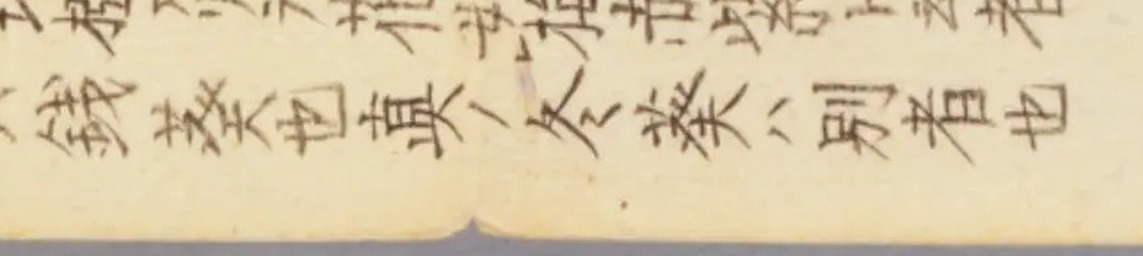ハ銭葵也真ノ冬葵ハ別物也
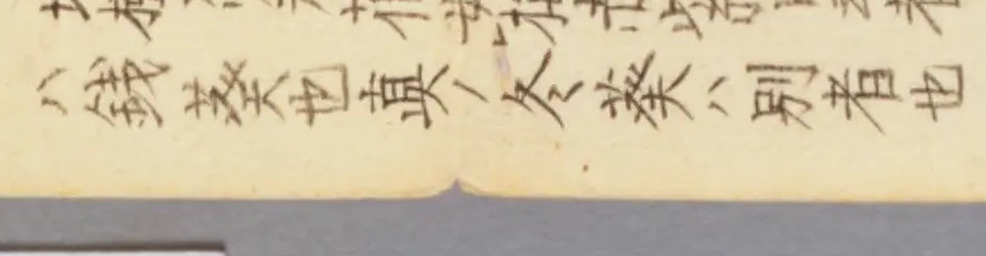ハ銭葵也真ノ冬葵ハ別物也
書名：梅園草木花譜夏之部. 4
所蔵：国立国会図書館 National Diet Library, JAPAN
